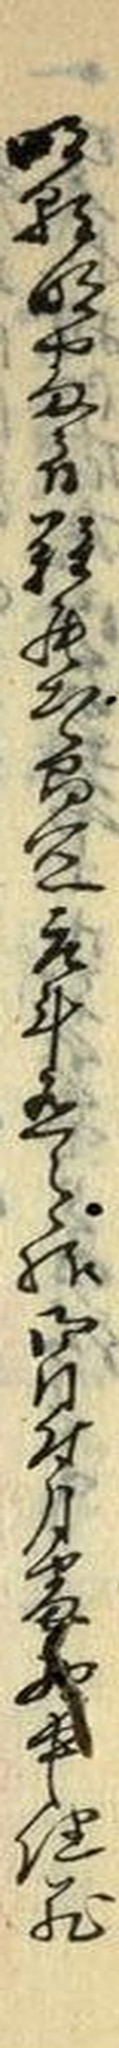明朝明番ニ付難罷出候間宜取計有之候様御目付月番野中健蔵
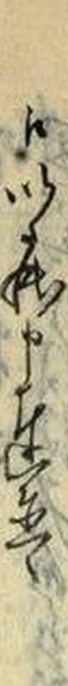江以手紙申達置候
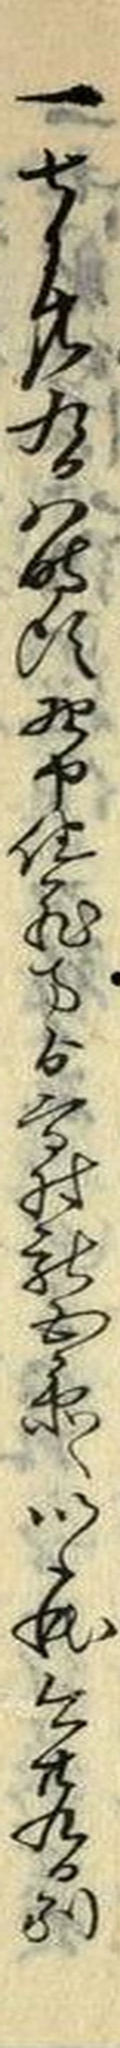一七月廿九日八時頃野中健蔵方ゟ高村新五兵衛へ以手紙今廿九日別
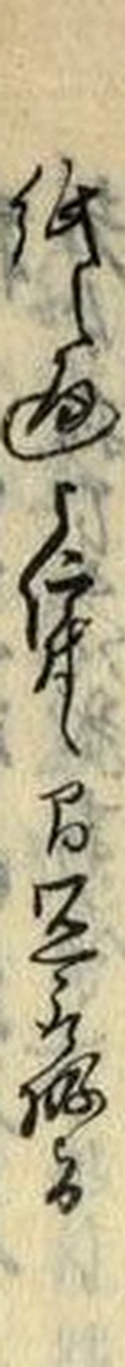紙之通被仰付候間宜取扱旨
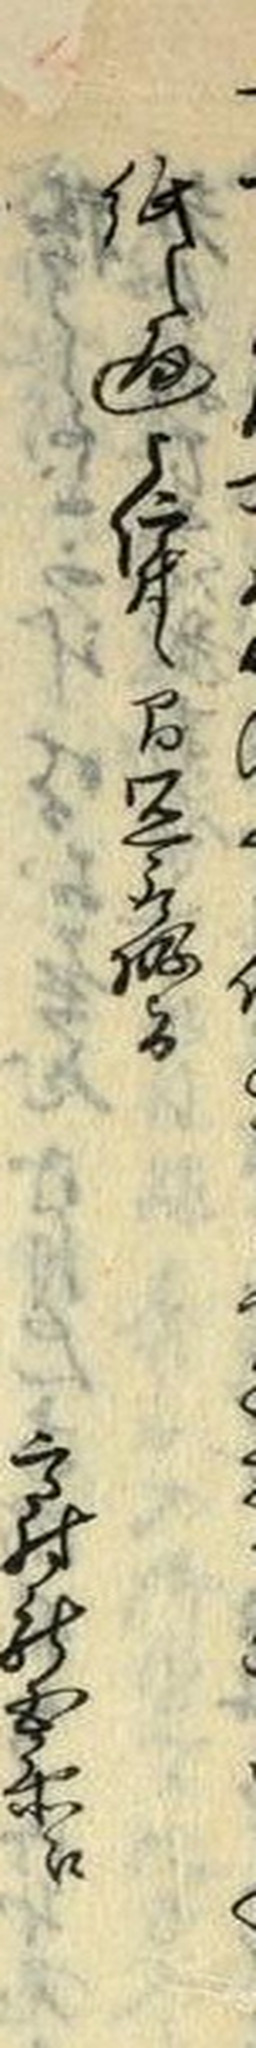高村新五兵衛江
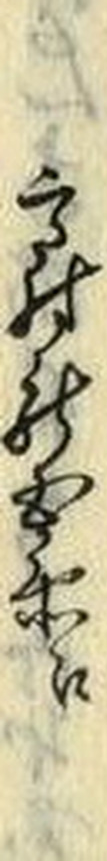高村新五兵衛江
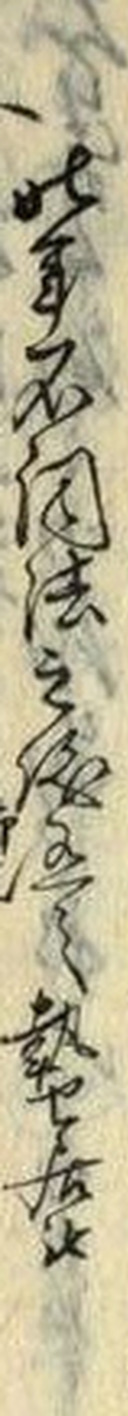昨年不調法之儀有之蟄居被
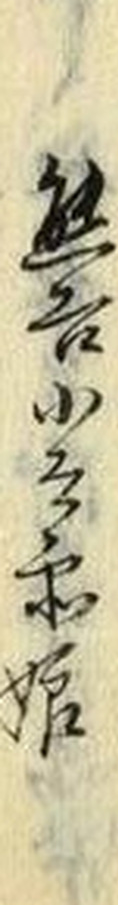熊谷小兵衛娘
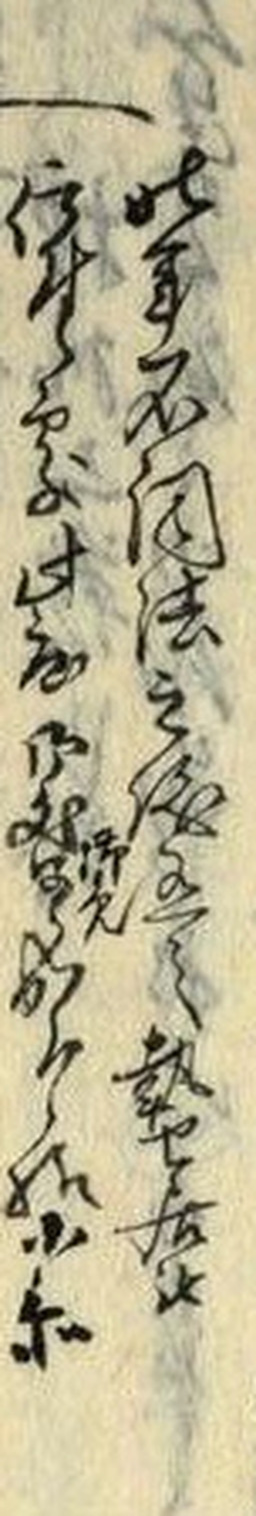仰付候処此度御咎御免被成候様小兵衛
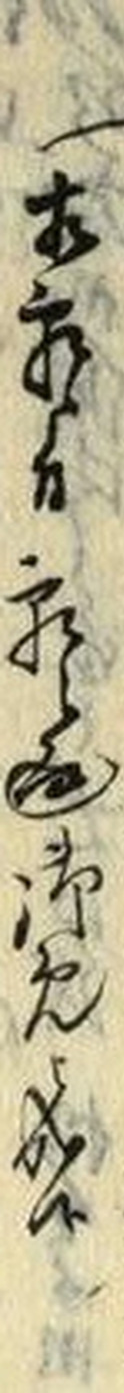相願候ニ付願之通御免被成候
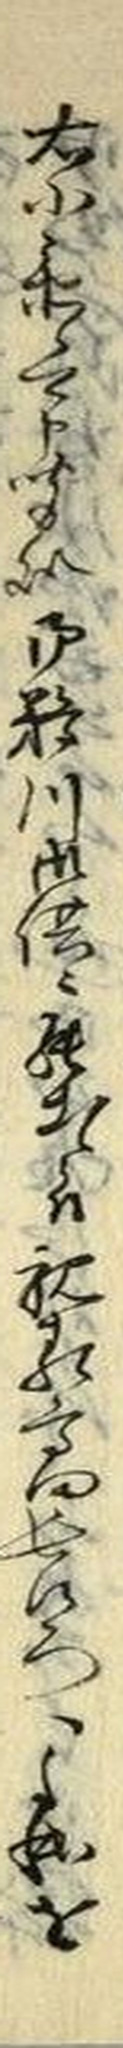右小兵衛へ可申聞処御鵜川御供ニ罷出候ニ付親類高田長左衛門へ手紙を
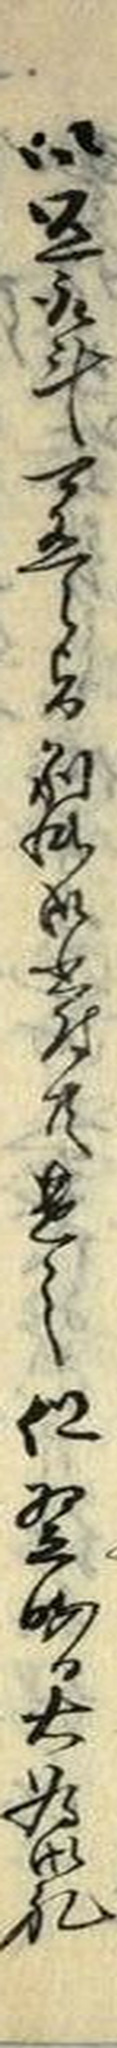以宜取計可有之旨別紙御書付共遣之但翌晦日右為御礼
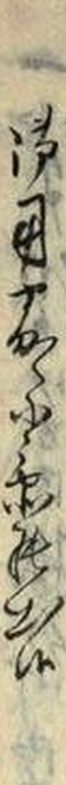御用番へ小兵衛罷出候
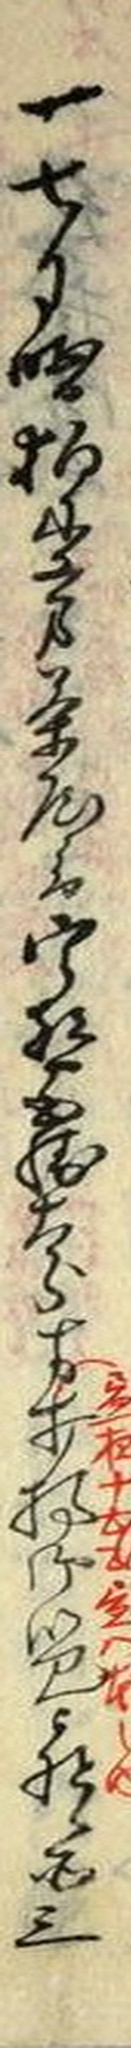一七月晦日狛木工方茶屋ニ而宇都宮勝太郎方打揚御覧被遊候所三
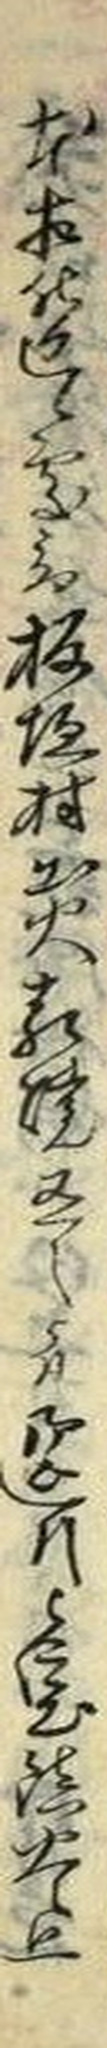本相仕廻候処ニ而板垣村出火類焼有之ニ付御延引被仰出鎮火之上
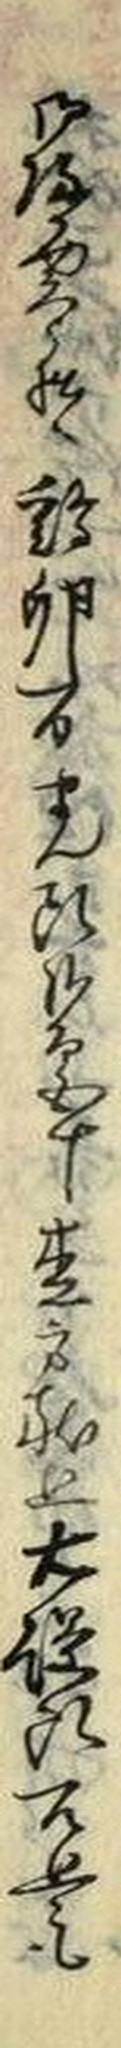御帰殿被遊候鶏卵百まん頭弐百五十木工方献上右饅頭召上ニも
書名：少傅日録抄（斉承付側向頭取日記、在国）
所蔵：福井県文書館 Fukui Prefectural Archives
